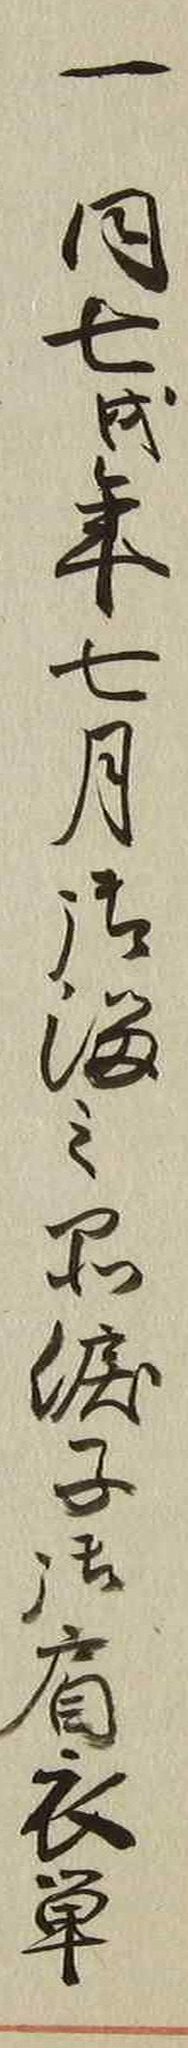一同七戌年七月御溜之品綟子御肩衣単
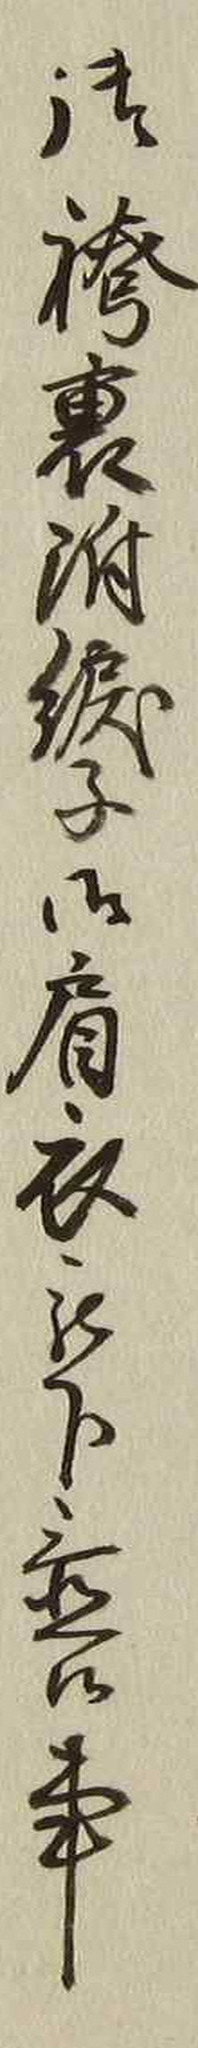御袴裏附綟子御肩衣被下置候事
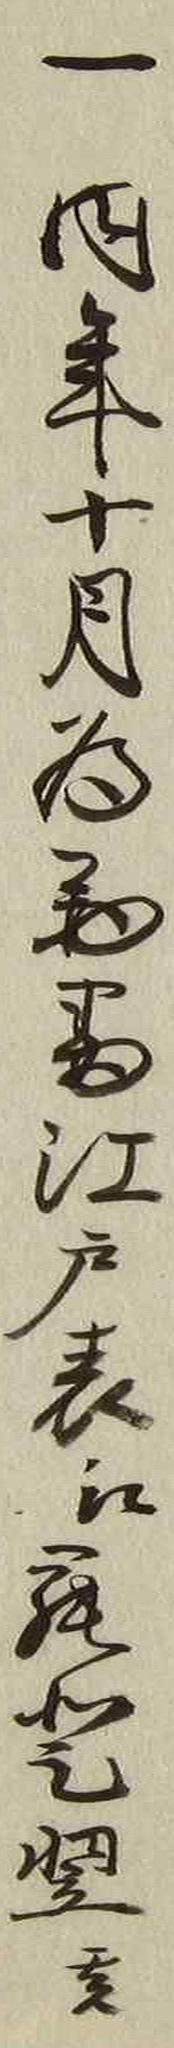一同年十月為勤番江戸表江罷登翌亥
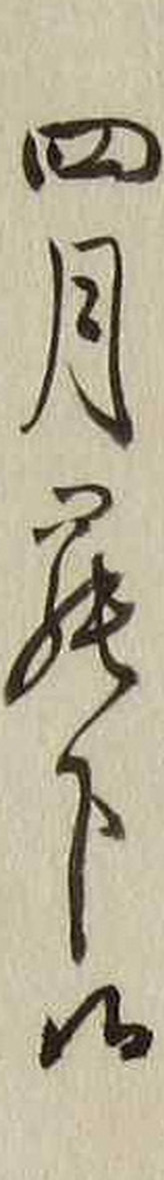四月罷下候
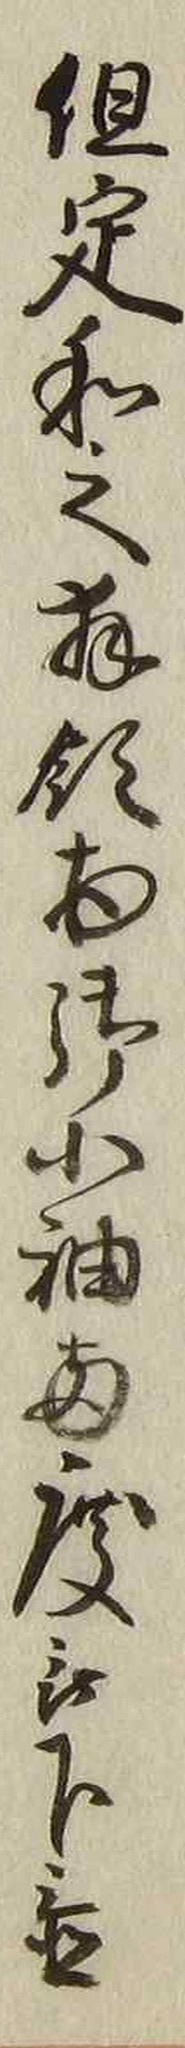但定和之拝領物御小袖両度被下置
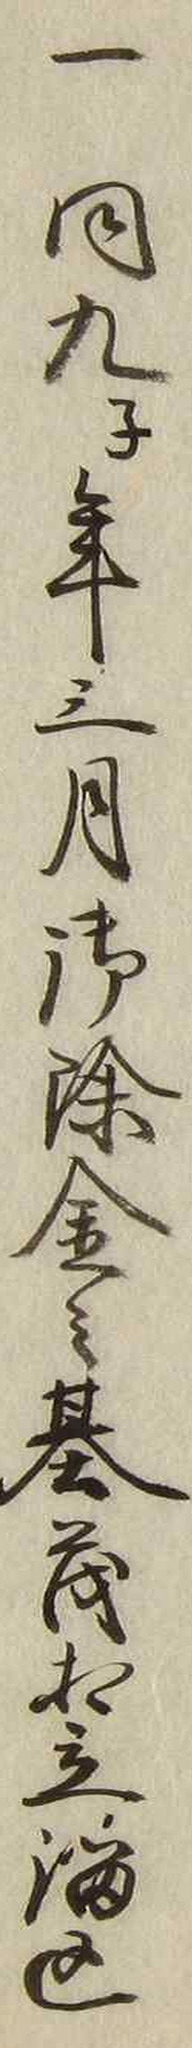一同九子年三月御除金之基も相立溜込
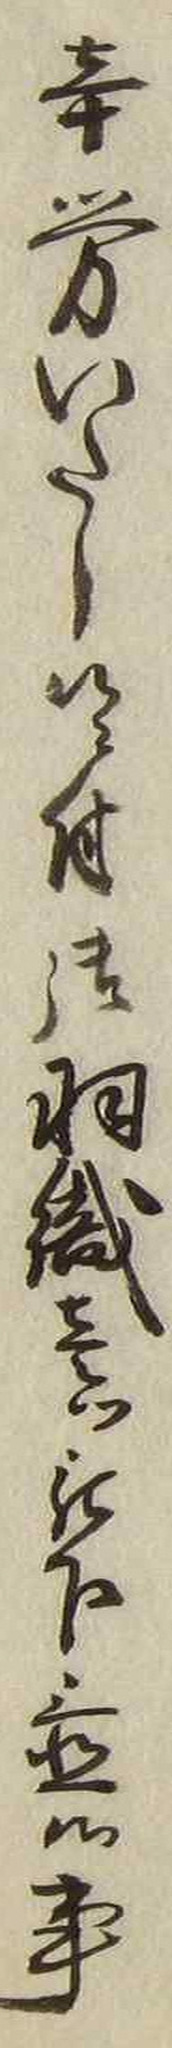辛労いたし候ニ付御羽織壱ツ被下置候事

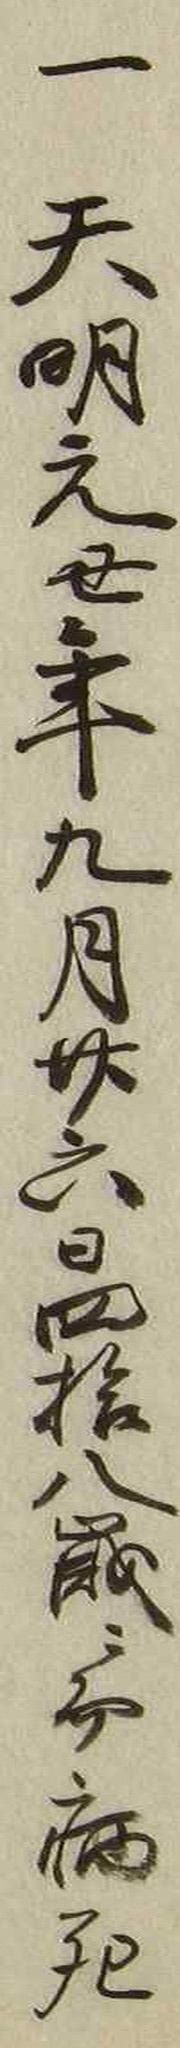一天明元丑年九月廿六日四拾八歳ニ而病死
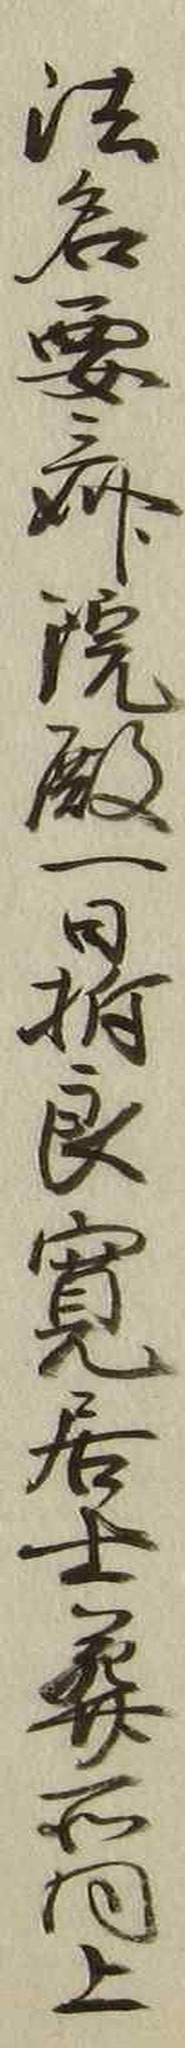法名要斎院殿一䁀良寛居士葬所同上
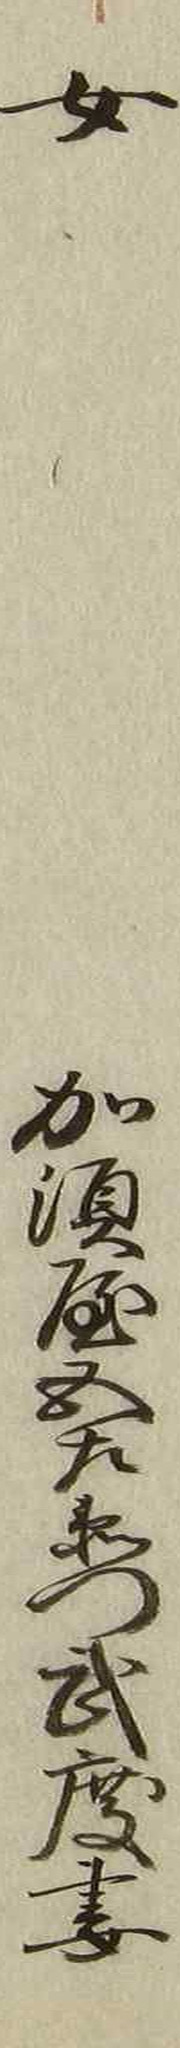女加須屋五左衛門武度妻
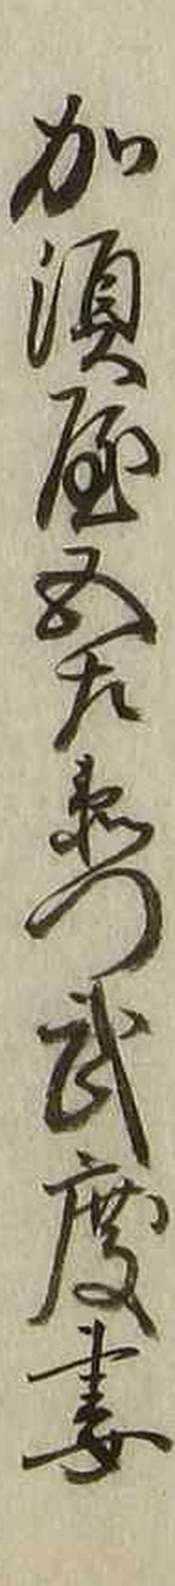女加須屋五左衛門武度妻
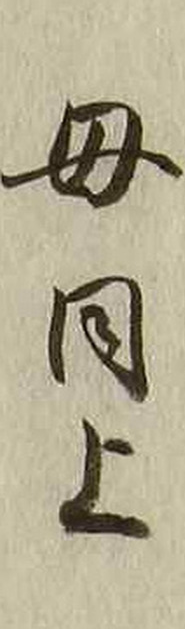母同上
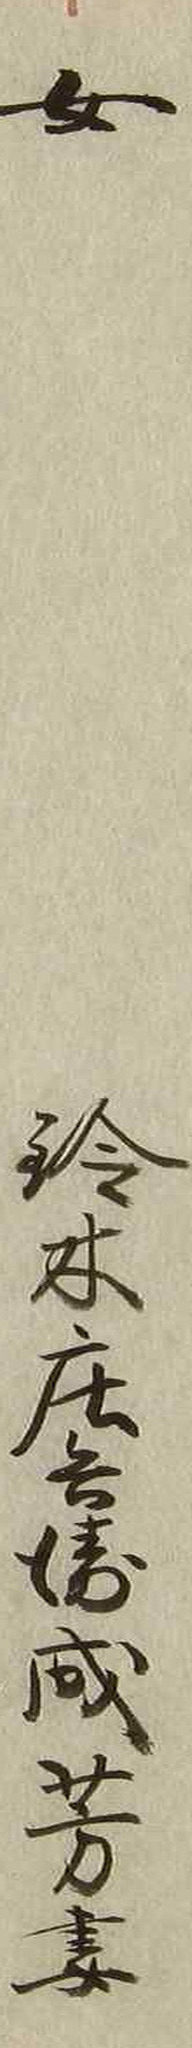女鈴木庄兵衛成芳妻
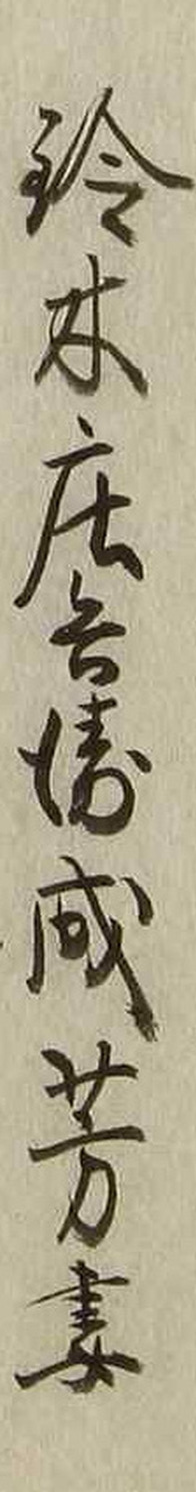女鈴木庄兵衛成芳妻
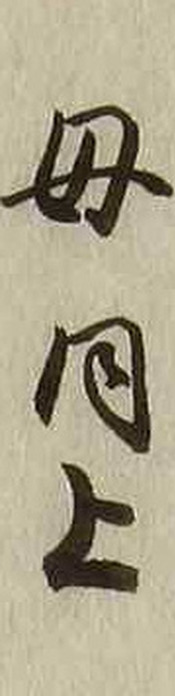母同上
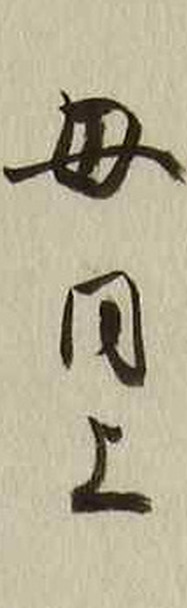母同上
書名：諸士系譜　巻之15　い之部15
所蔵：会津若松市立会津図書館
